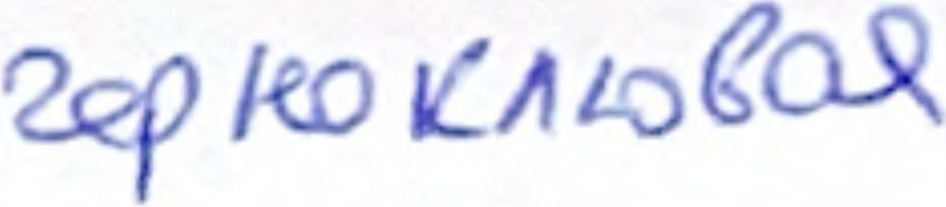черноклювая
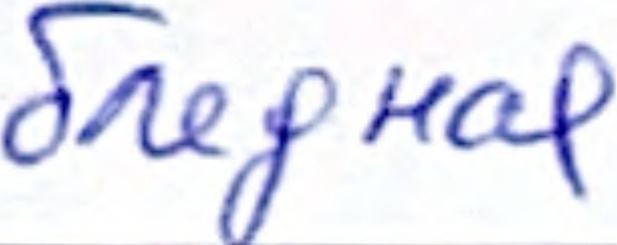бледная
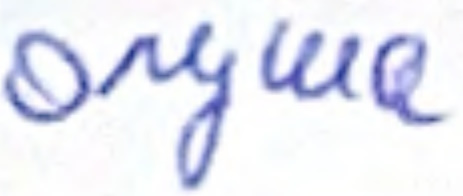олуша
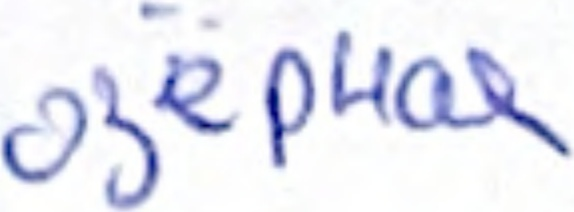озёрная
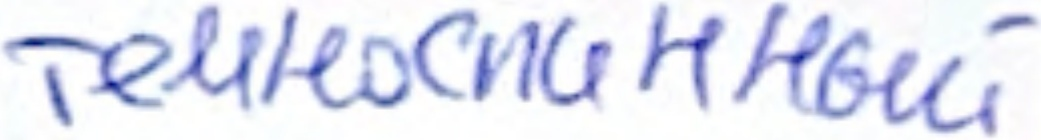темноспинный
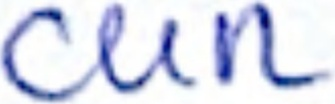сип
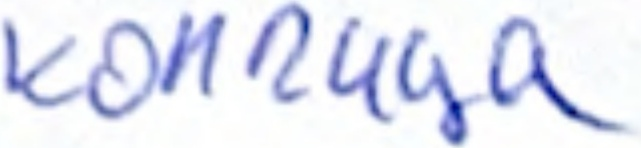кончица
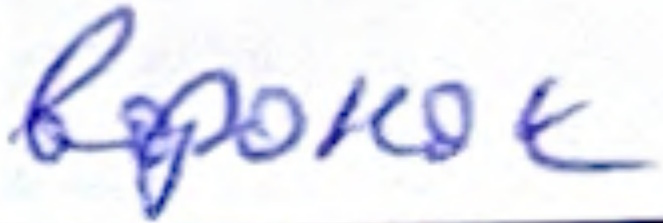воронок
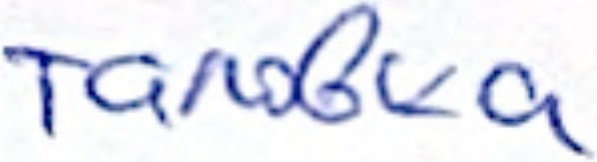таловка
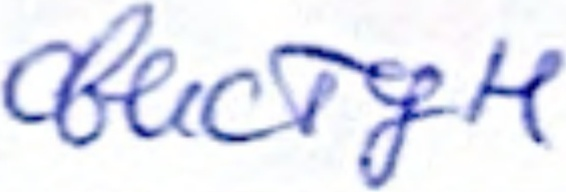свистун
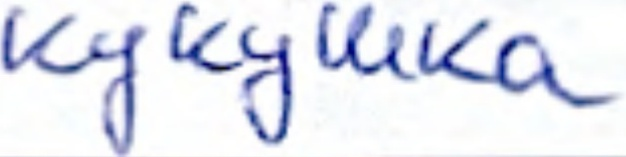кукушка
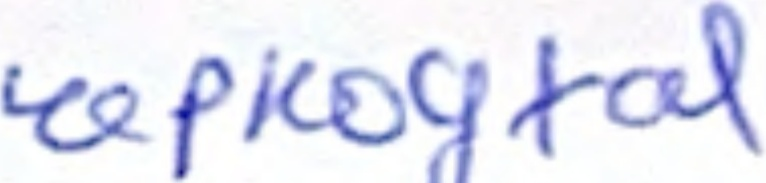черноухая
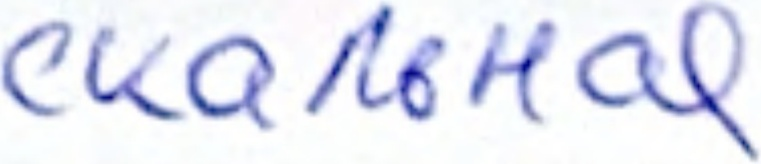скальная
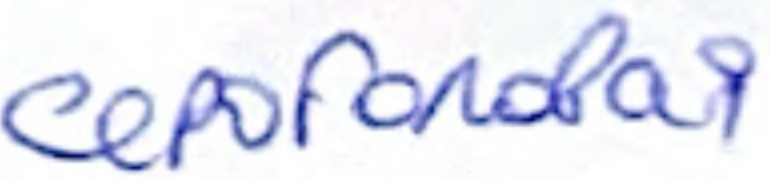сероголовая
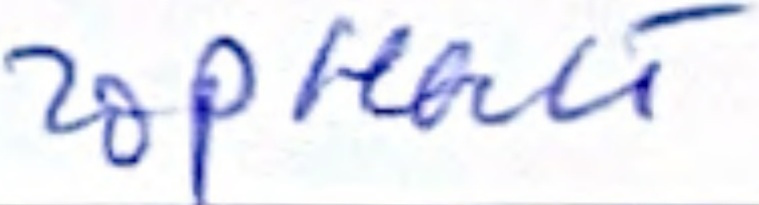горный
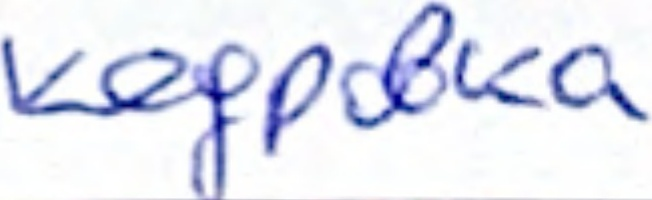кедровка
